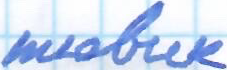тювик
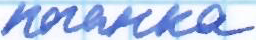поганка
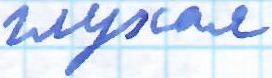глухая
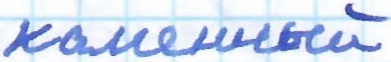каменный
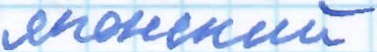японский
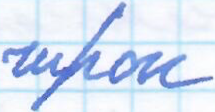чирок
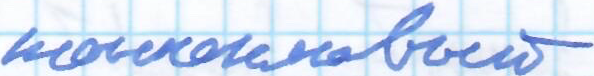тонкоклювый
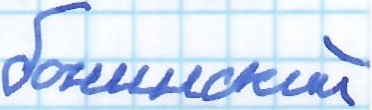бонинский
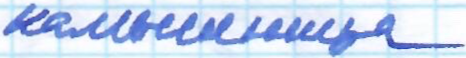камышница
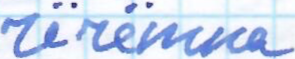чёчётка
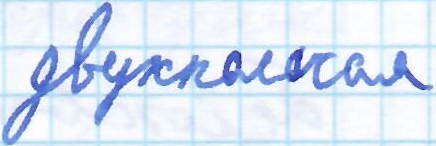двухполосая
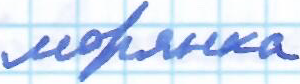морянка
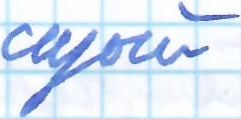сизый
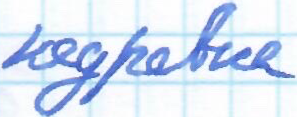кедровка
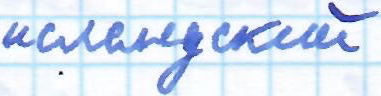исландский
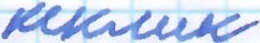кеклик
